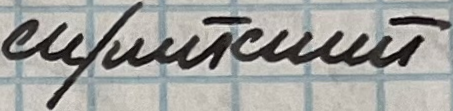сирийский
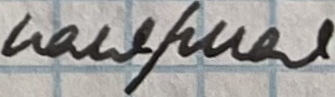полярная
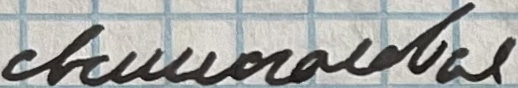светлоголовая
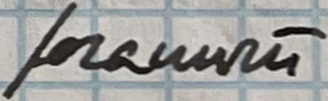рогатый
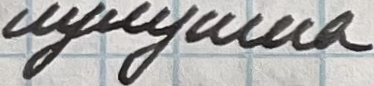кукушка
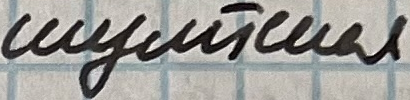индийская
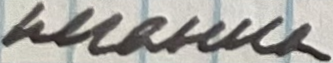пеганка
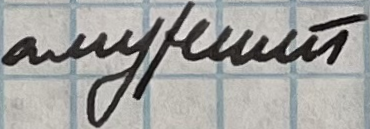амурский
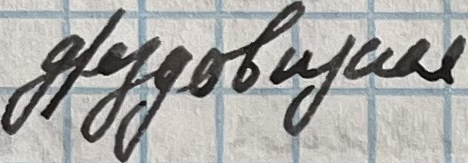дроздовидная
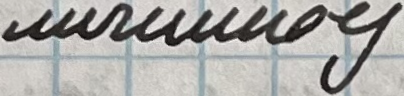личинкоед
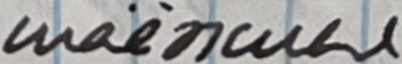таёжная
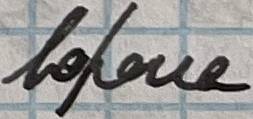ворона
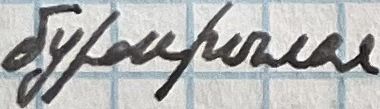бурокрылая
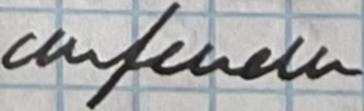стрепет
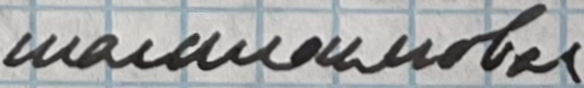толстоклювая
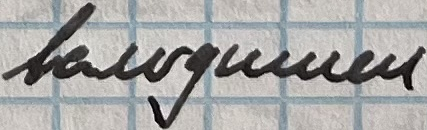вальдшнеп
